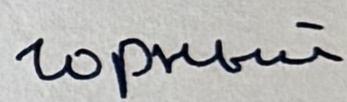горный
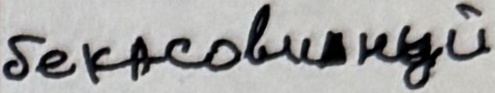бекасовиднуй
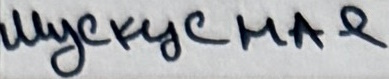мускусная
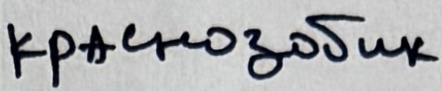краснозобик
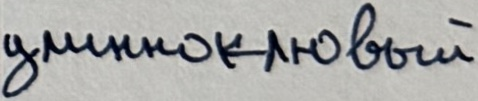длинноклювый
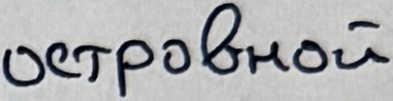островной
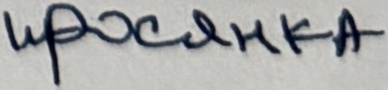просянка
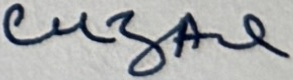сизая
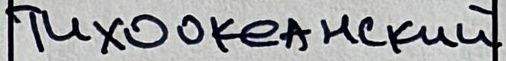тихоокеанский
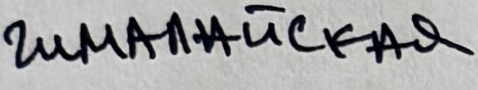гималайская
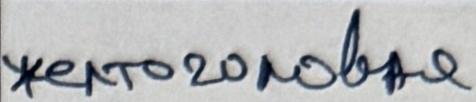желтоголовая
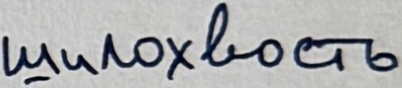шилохвость
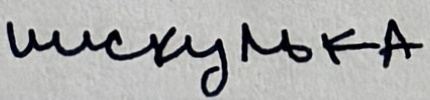пискулька
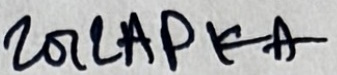гыгарка
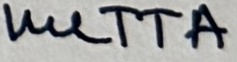питта
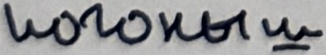погоныш
